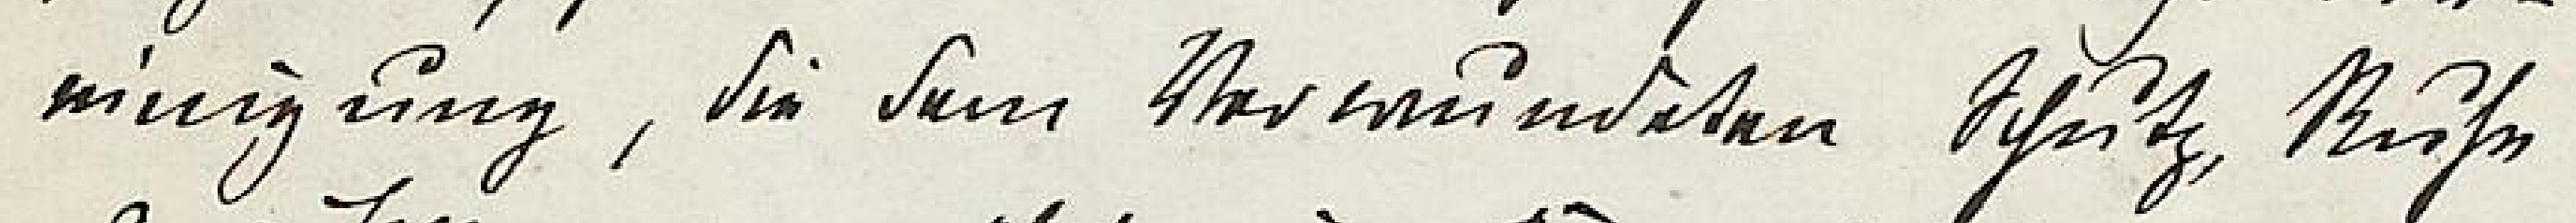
einigung, die dem Verwundeten Schutz, Ruhe
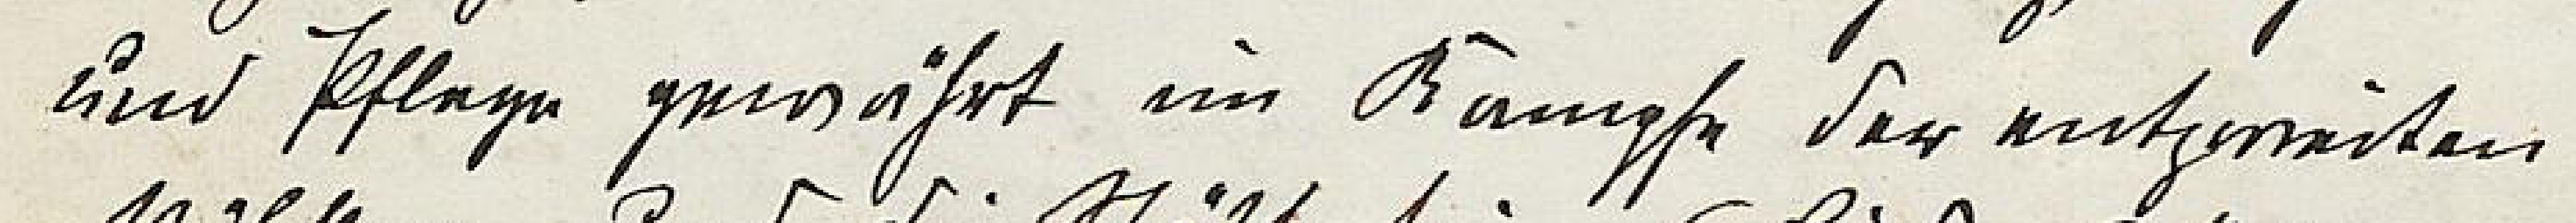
und Pflege gewöhrt im Kampfe der entzweiten
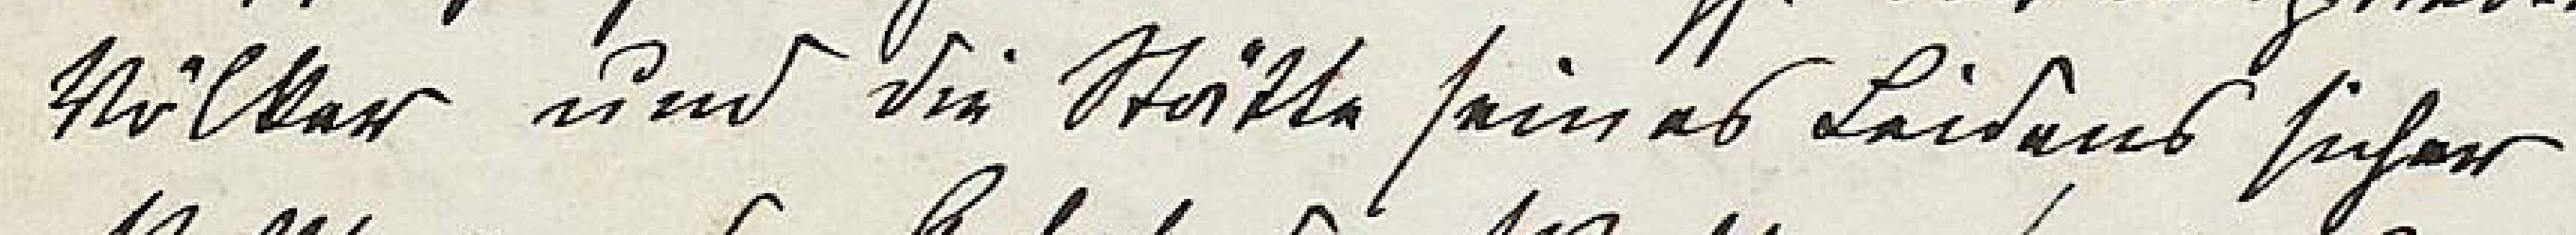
Völker und die Stötte seines Leidens tiefer
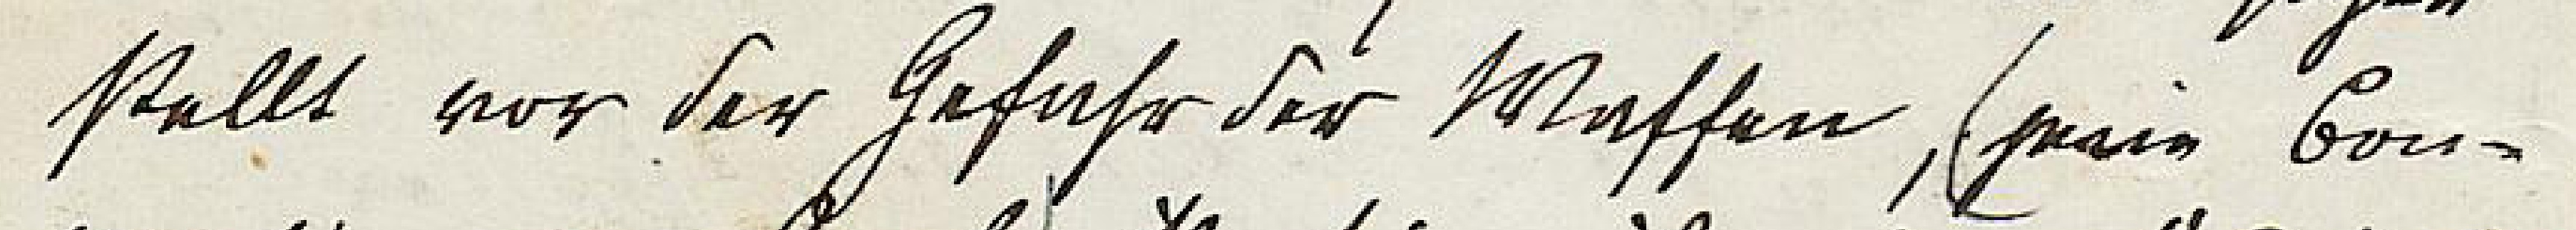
stellt vor der Gefahr der Waffen, (jene Con¬
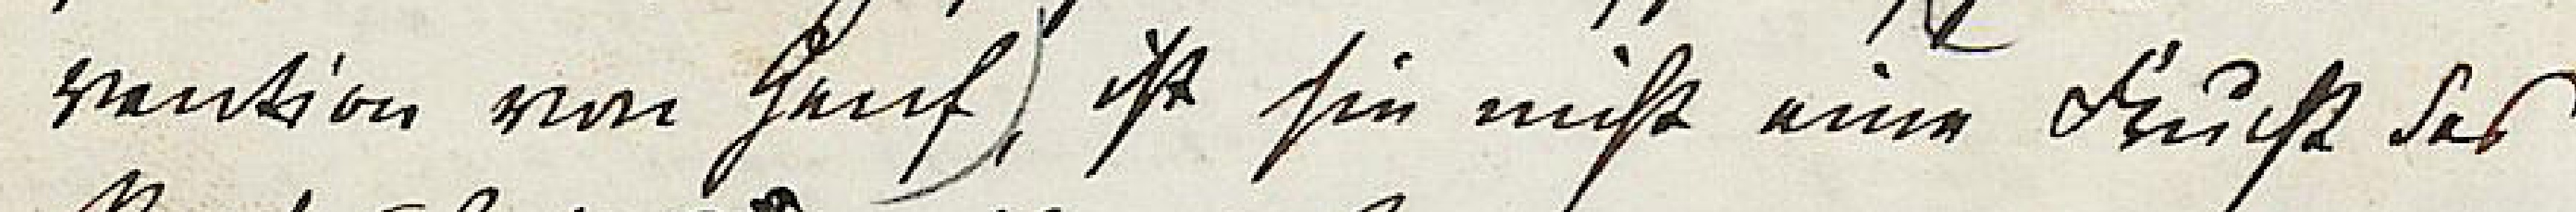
vention von Genf), ist sie nicht eine Frucht des
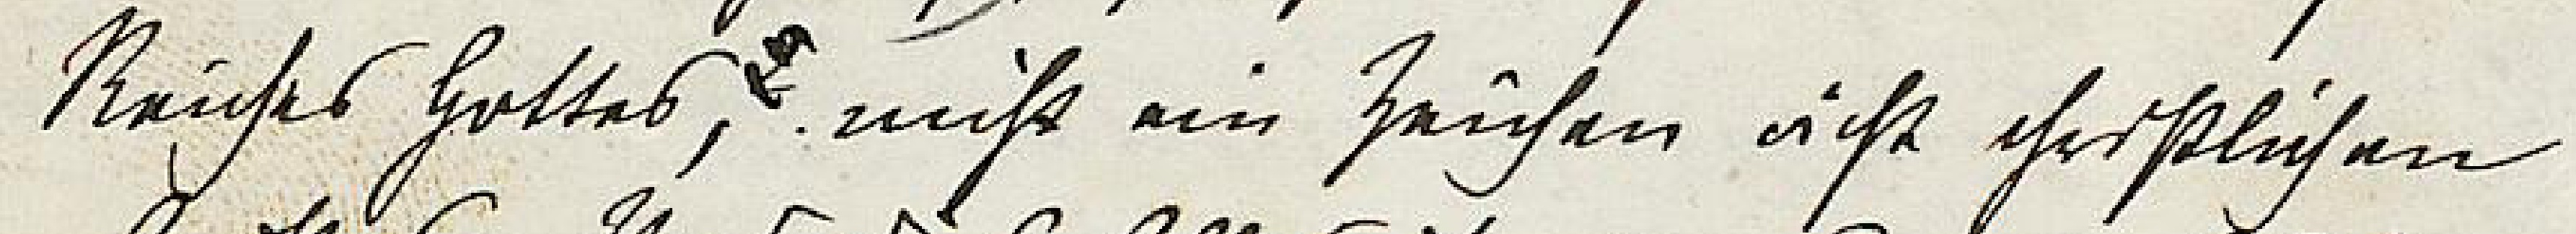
Reiches Gottes, nicht ein Zeichen ächt christlichen
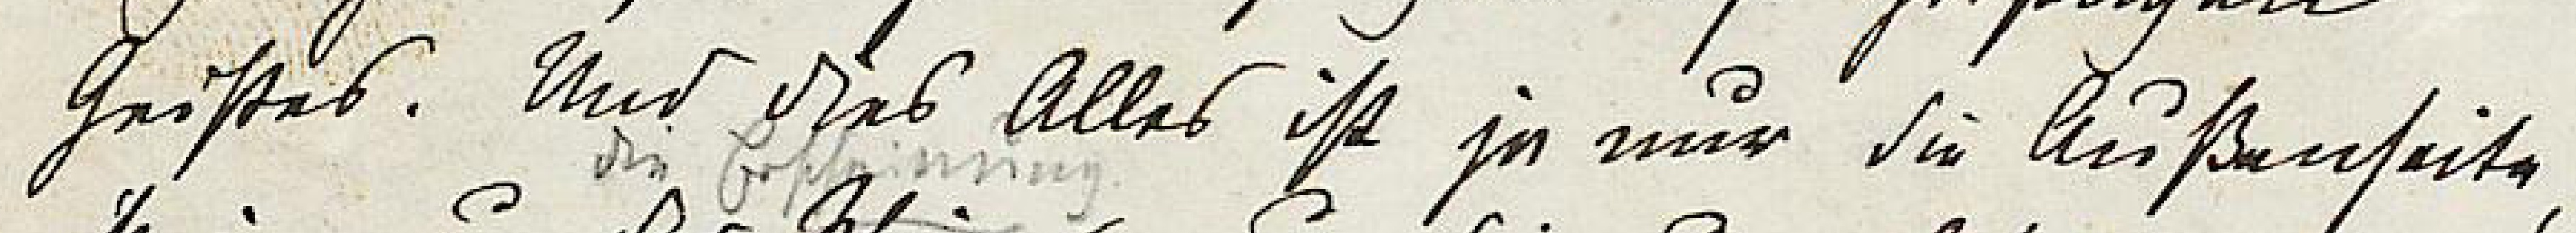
Geistes. Und dies Alles ist ja nur die Außenseite,
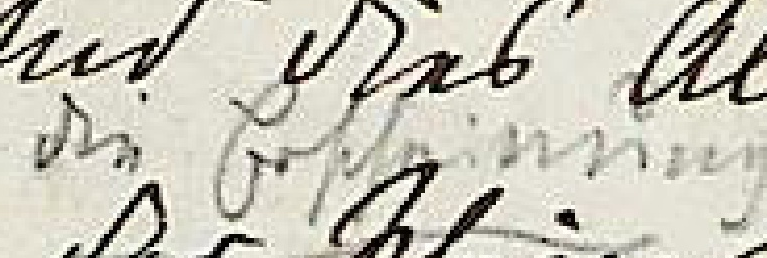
die Erscheinung
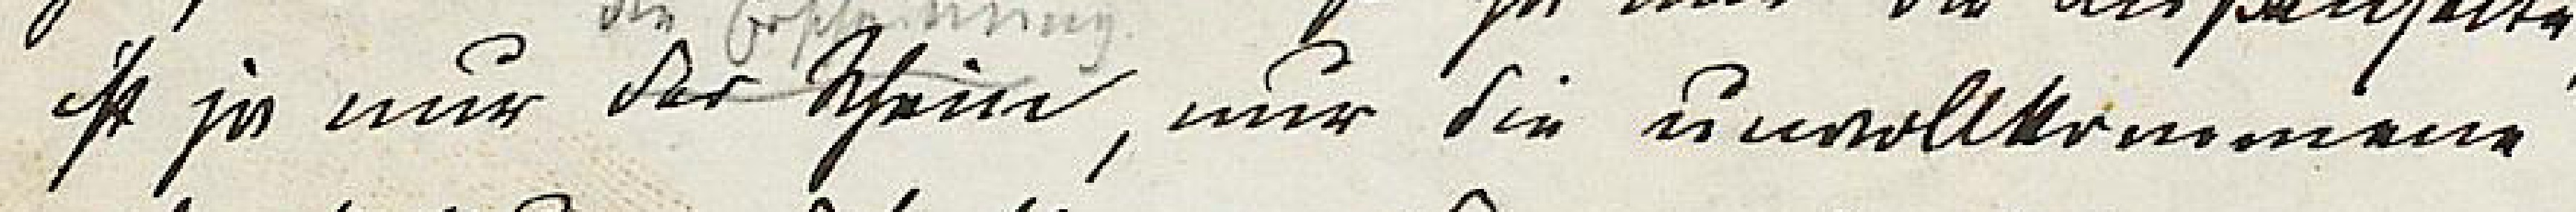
ist ja nur der Schein, nur die unvollkommene
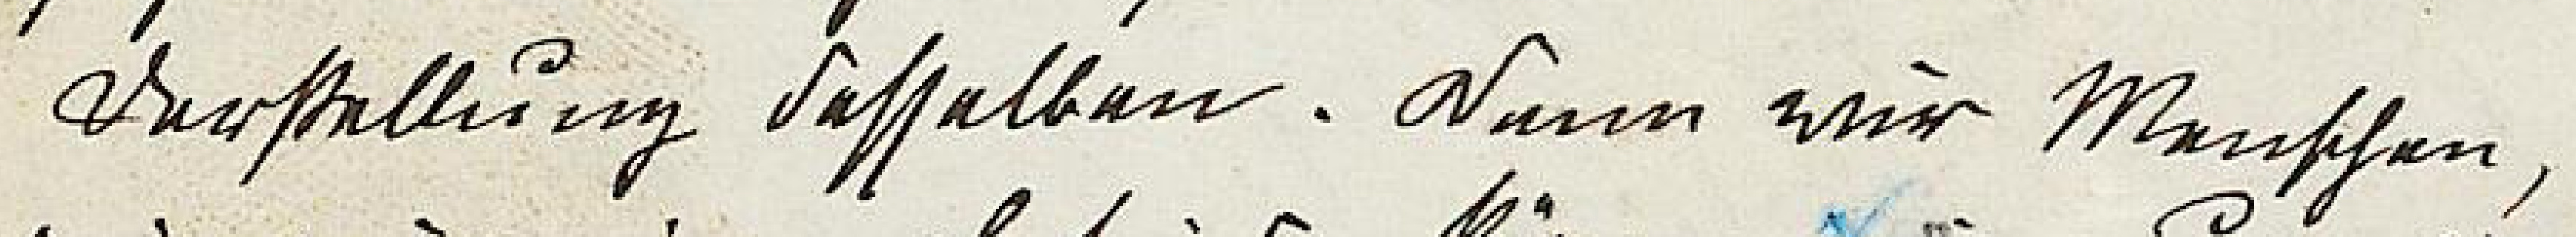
Darstellung desselben. Denn wir Menschen,
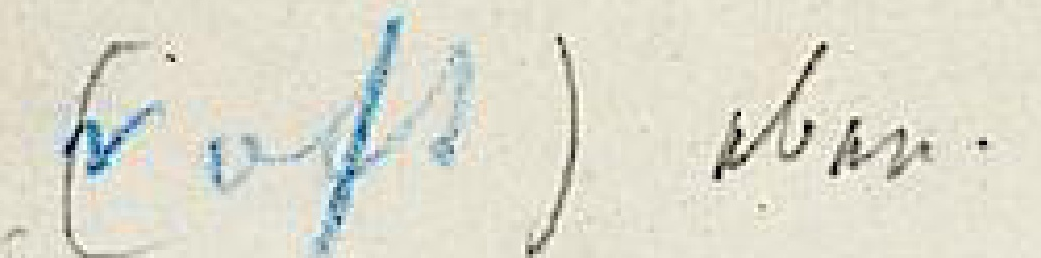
(n oft) eben
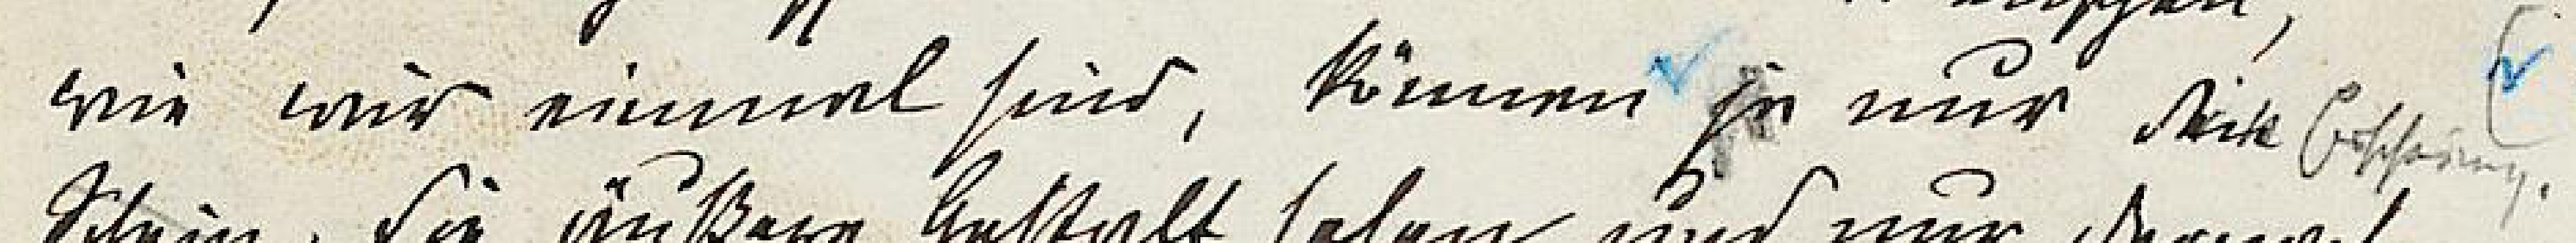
wie wir einmal sind, können V ja nur diese Erscheinung
